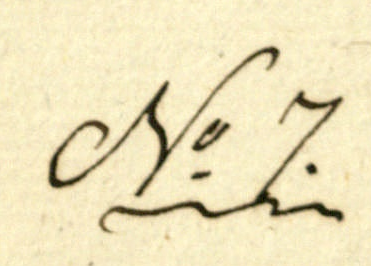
No 7.
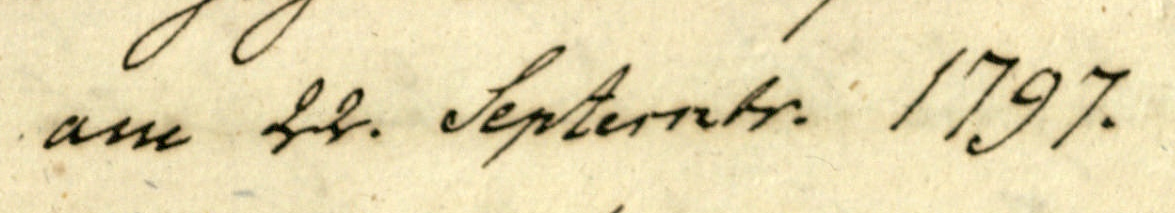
am 22. Septembr. 1797.
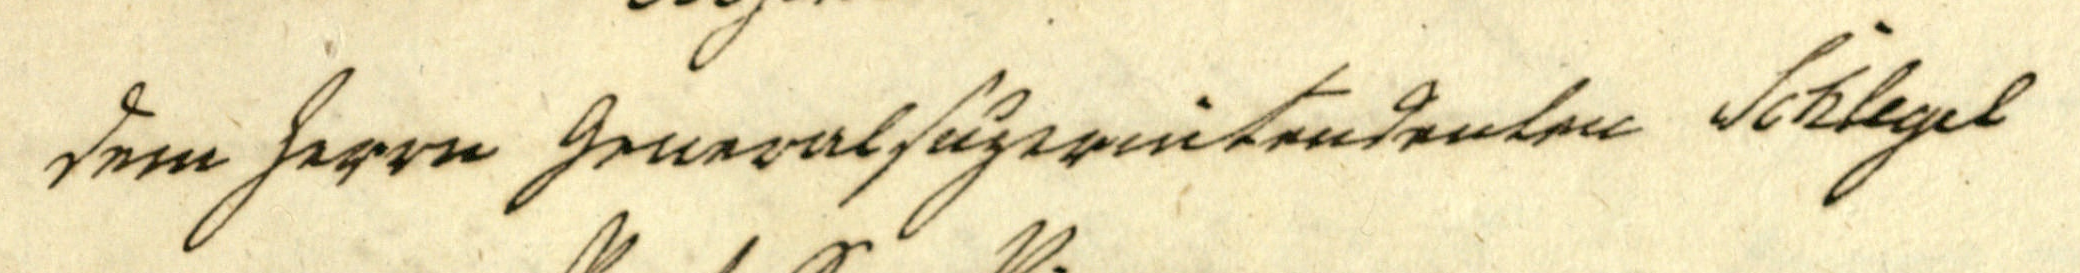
dem Herrn Ggeneralsuperintendenten Schlegel
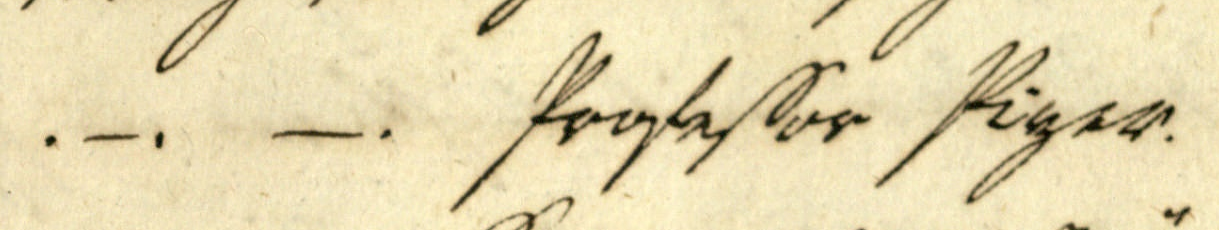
— " — . Professor Piper.
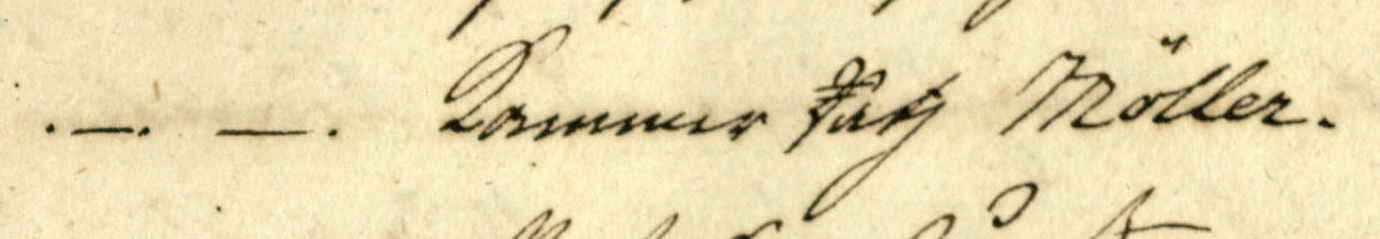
.Kammer Rath Möller.
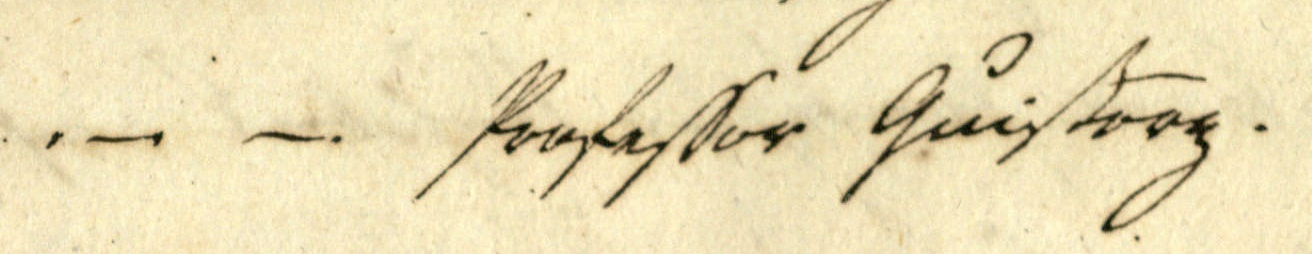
- Professor Quistorp.
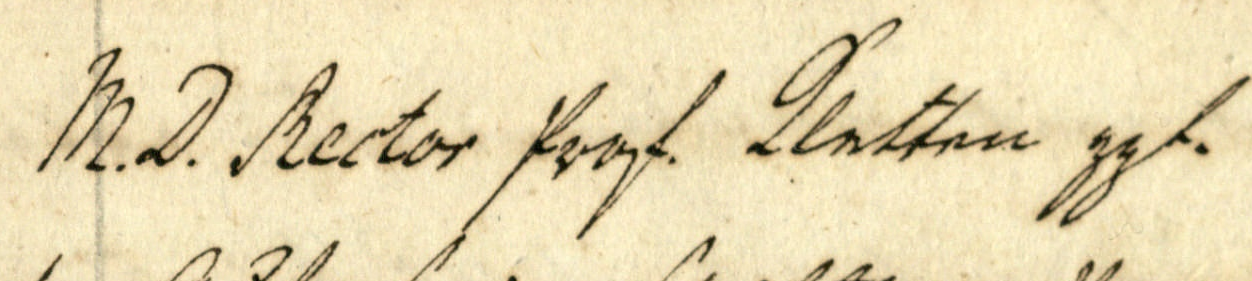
M. D. Rector Prof. Kletten ppt.
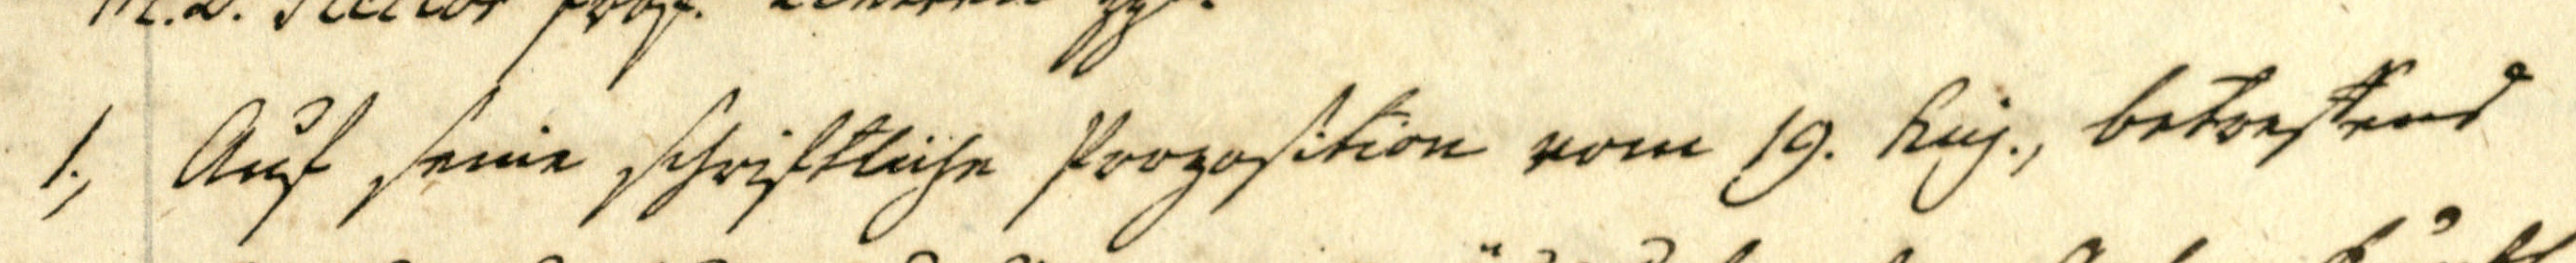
1., Auf seine schriftliche Proposition vom 19. huj., betreffend
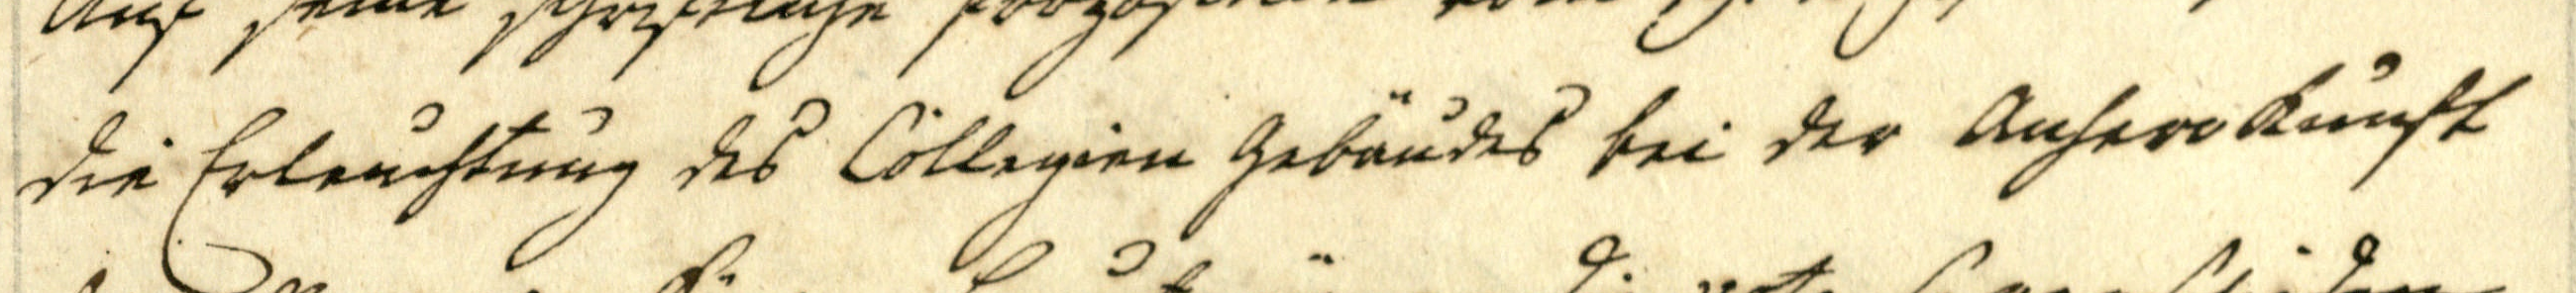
die Erleuchtung des Collegien Gebäudes bei der Anherokunft
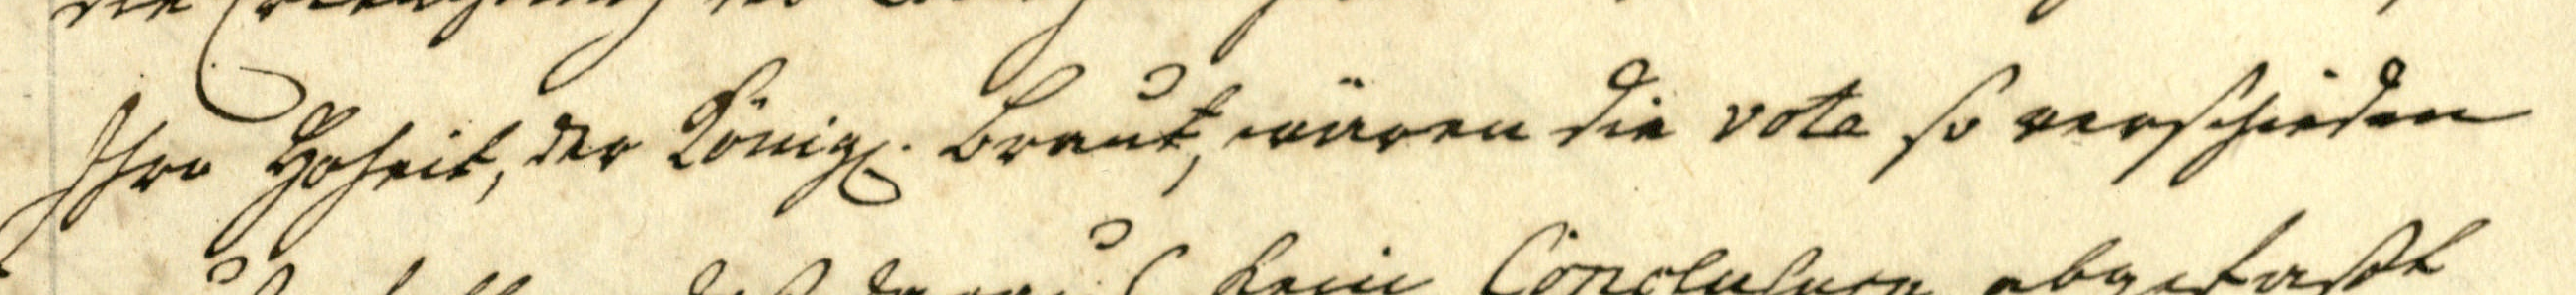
Ihrer Hoheit, der Königl. Braut, wären die vota so verschieden
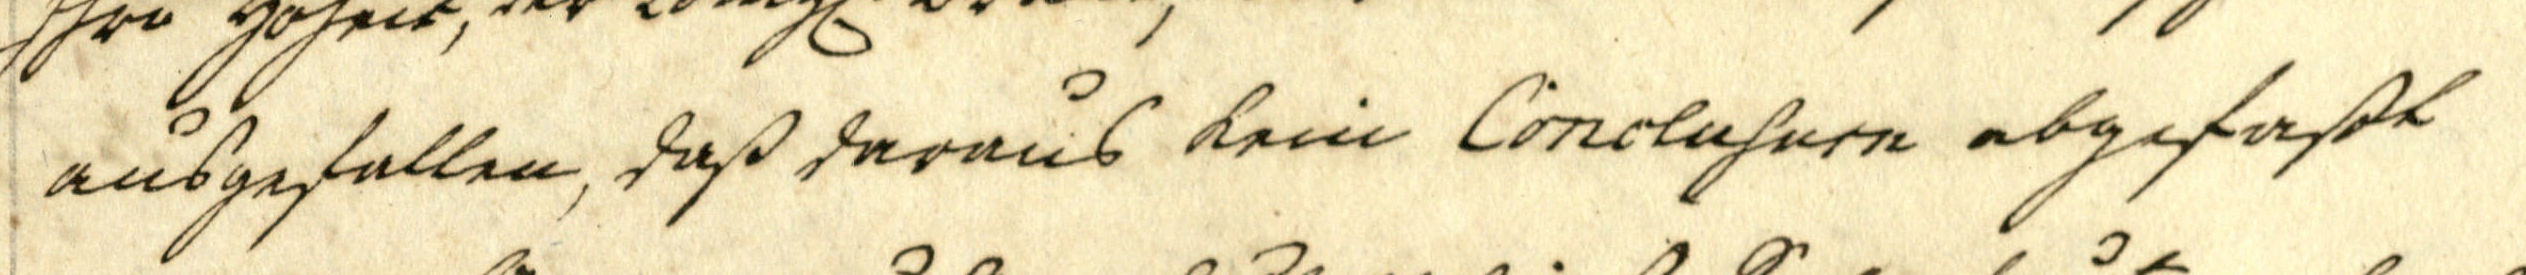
ausgefallen, daß daraus kein Conclusum abgefaßt
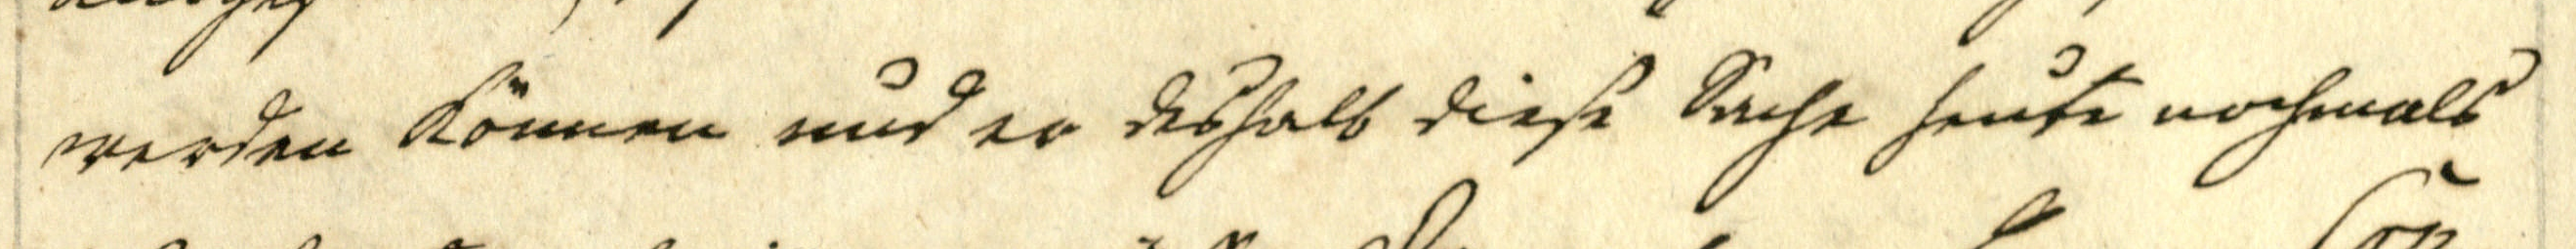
werden können und er deshalb diese Sache heute nochmals
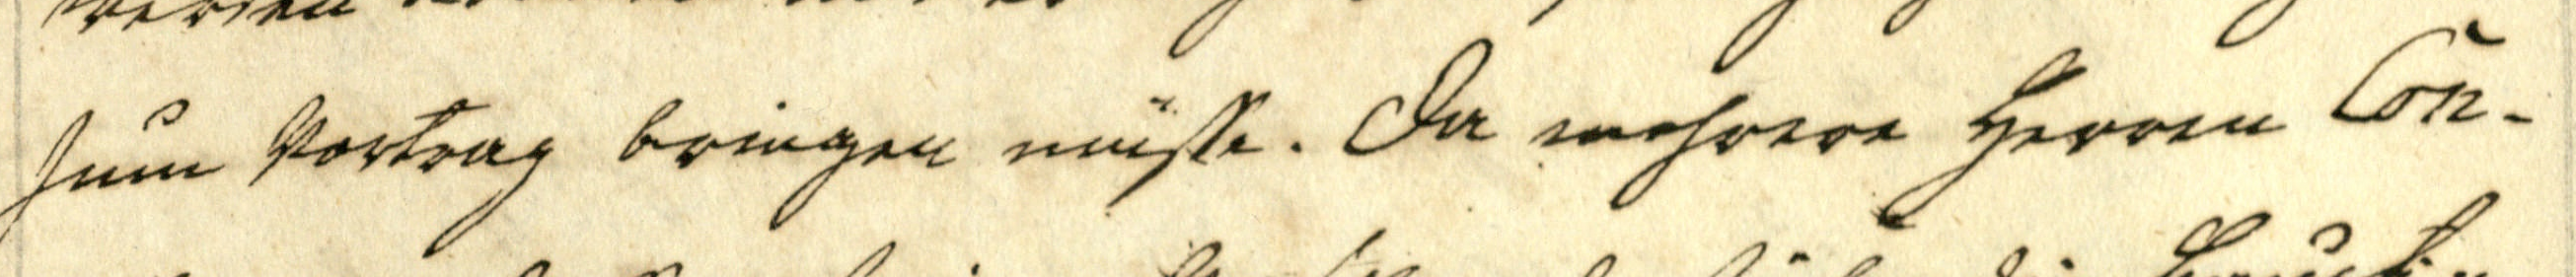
zum Vortrag bringen müsse. Da mehrere Herren Con¬
